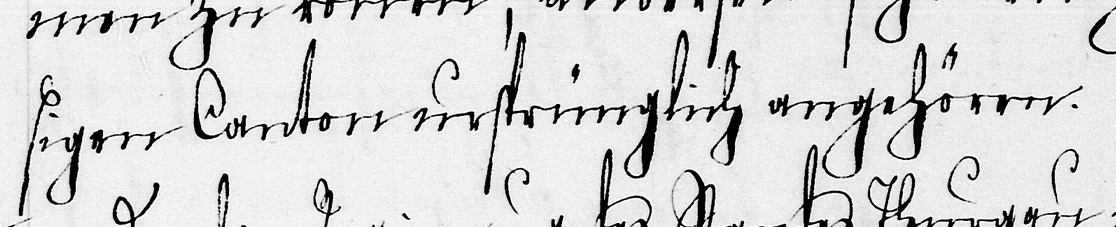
sigen Canton ursprünglich angehören.
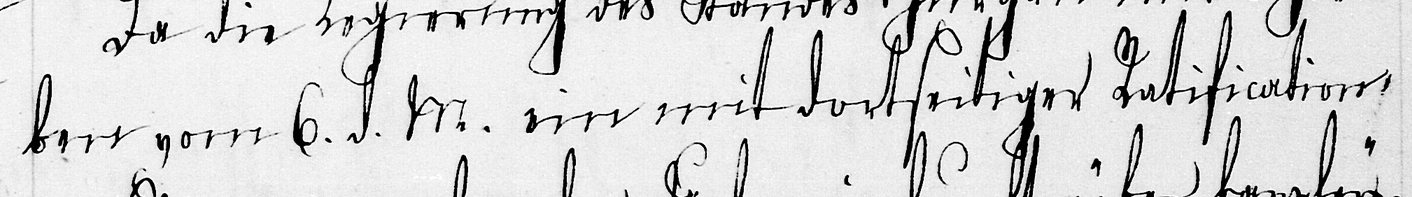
ben vom 6. d. M. ein mit dortseitiger Ratification
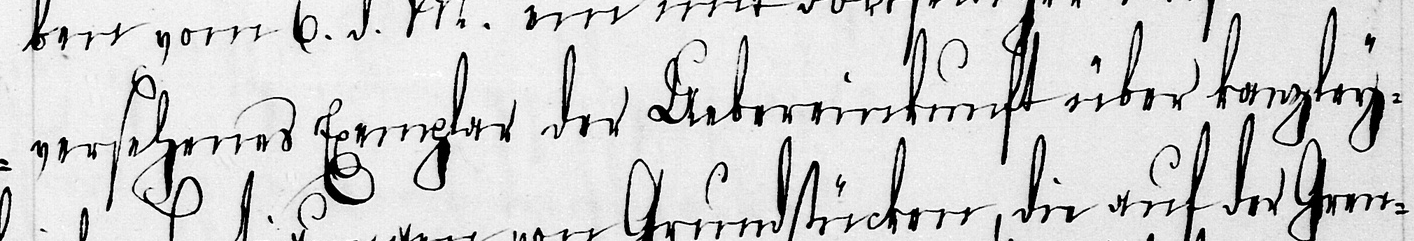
versehenes Exemplar der Uebereinkunft über kanzley¬
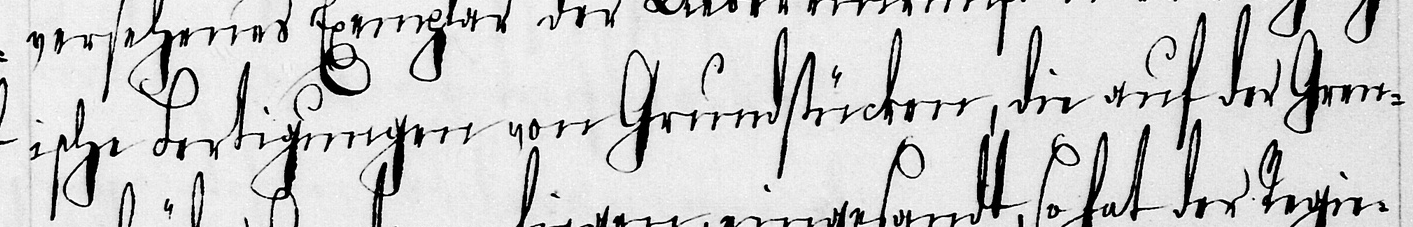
ische Fertigungen von Grundstücken, die auf der Gren¬
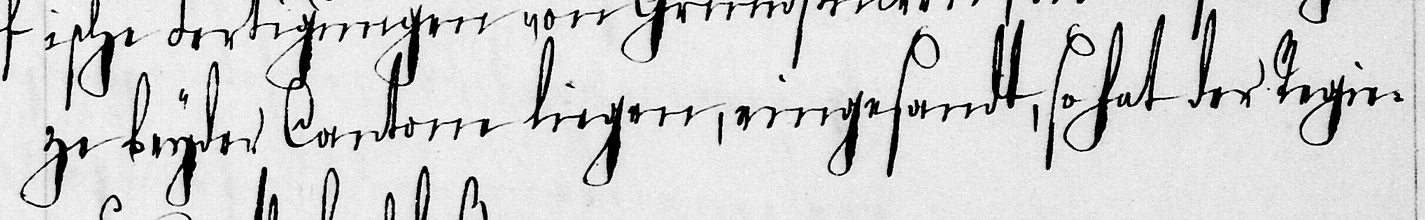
ze beyder Cantone liegen, eingesandt, so hat der Regie¬
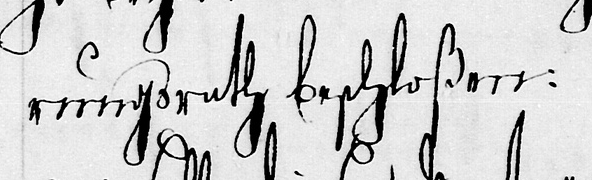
rungsrath, beschloßen:
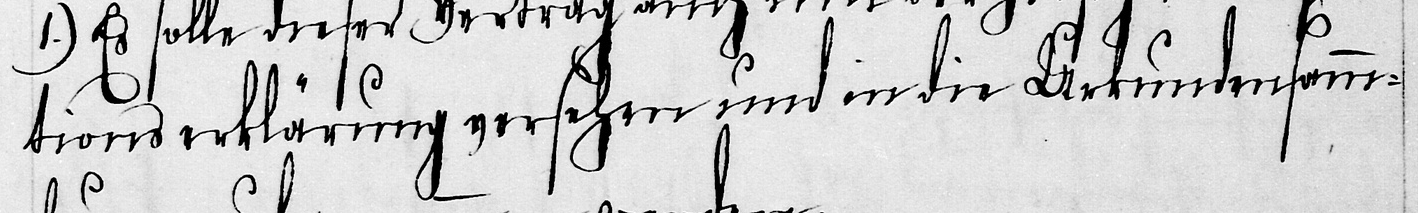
tionserklärung versehen und in die Urkundensamm¬
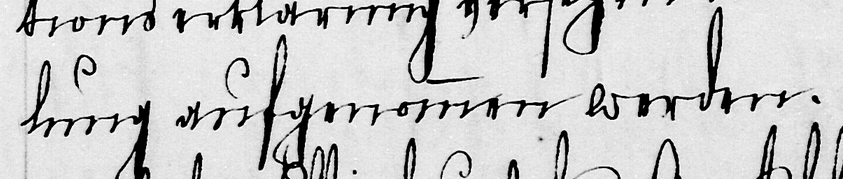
lung aufgenommen werden.
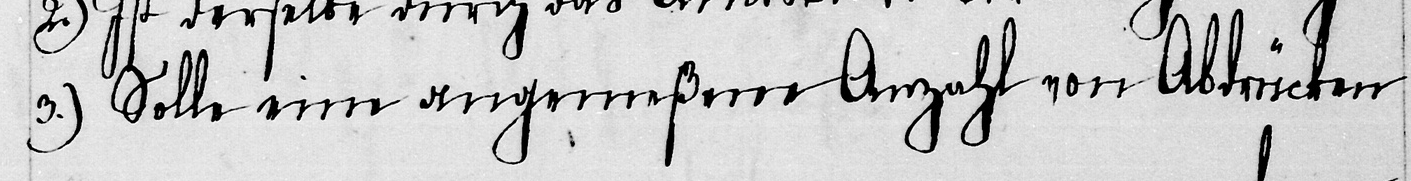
3.) Solle eine angemeßene Anzahl von Abdrücken
